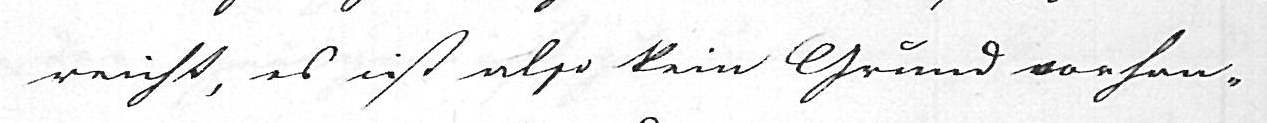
reicht, es ist also kein Grund vorhan-
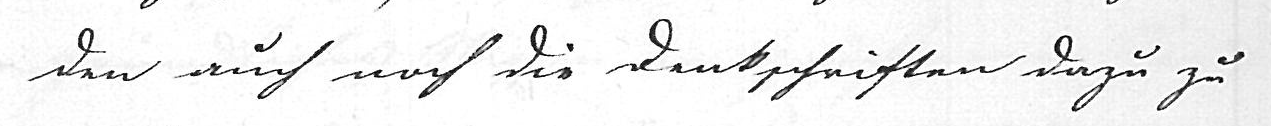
den auch noch die Druckschriften dazu zu
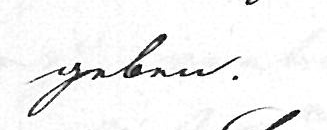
geben.
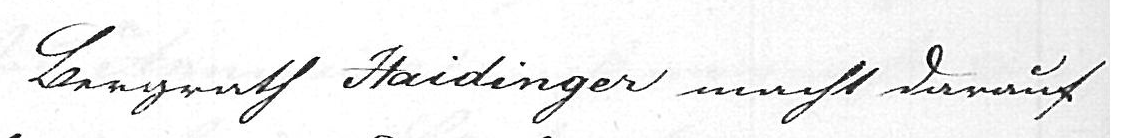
Bergrath Haidinger macht darauf
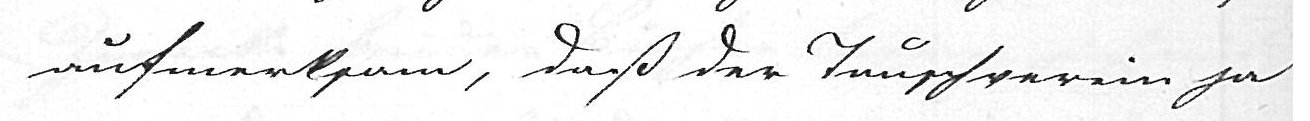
aufmerksam, daß der Tauschverein ja
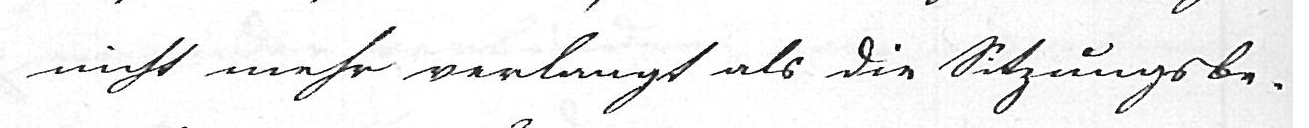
nicht mehr verlangt als die Sitzungsbe-
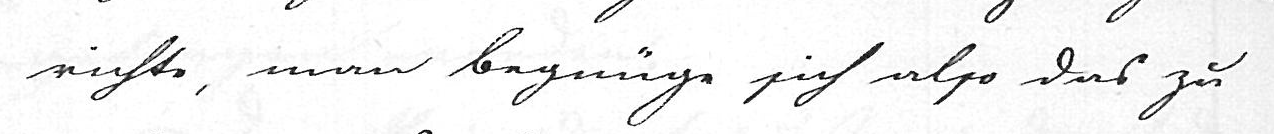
richte, man begnüge sich also das zu
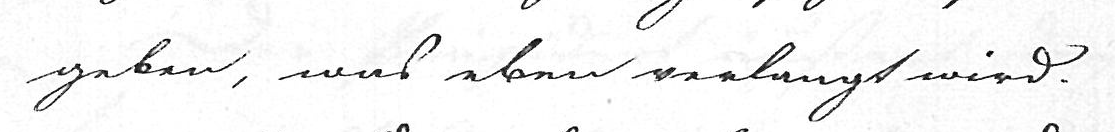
geben, was eben verlangt wird.
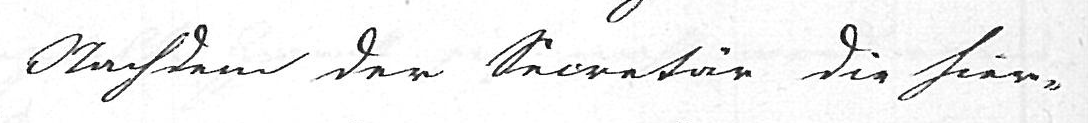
Nachdem der Secretär die hier-
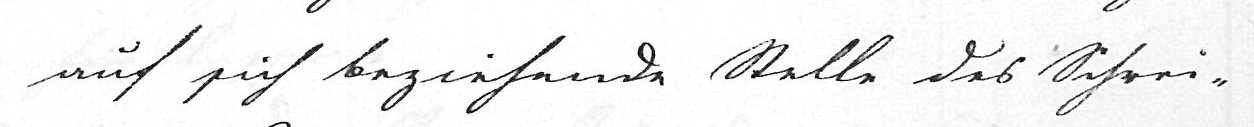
auf sich beziehende Stelle des Schrei-
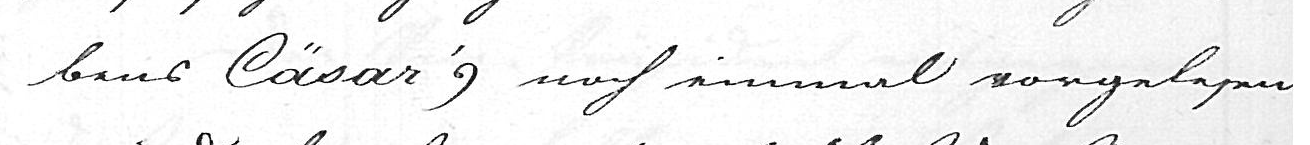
bens Cäsar's noch einmal vorgelesen
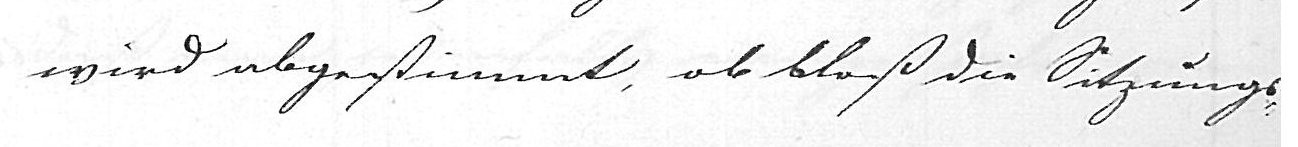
wird abgestimmt, ob bloß die Sitzungs-
